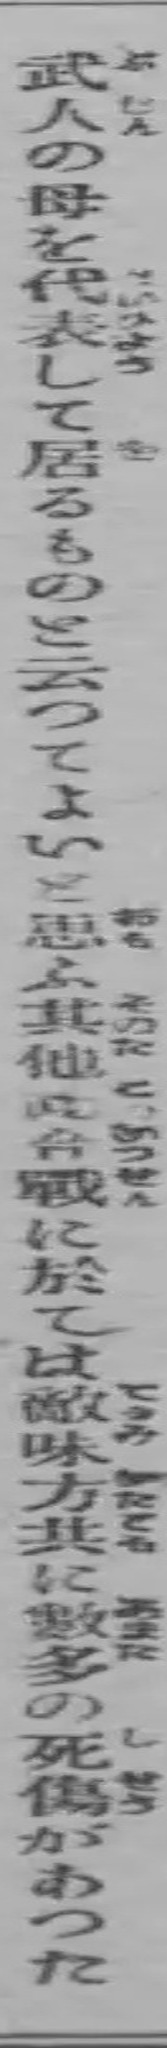武人の母を代表して居るものと云つてよいと思ふ其他此合戦に於ては敵味方共に数多の死傷があつた
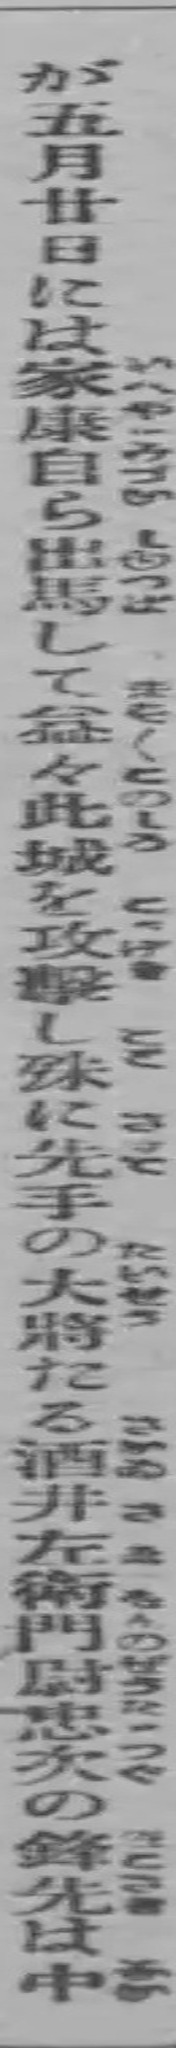が五月廿日には家康自ら出馬して益々此城を攻撃し殊に先手の大将たる酒井左衛門尉忠次の鉾先は中
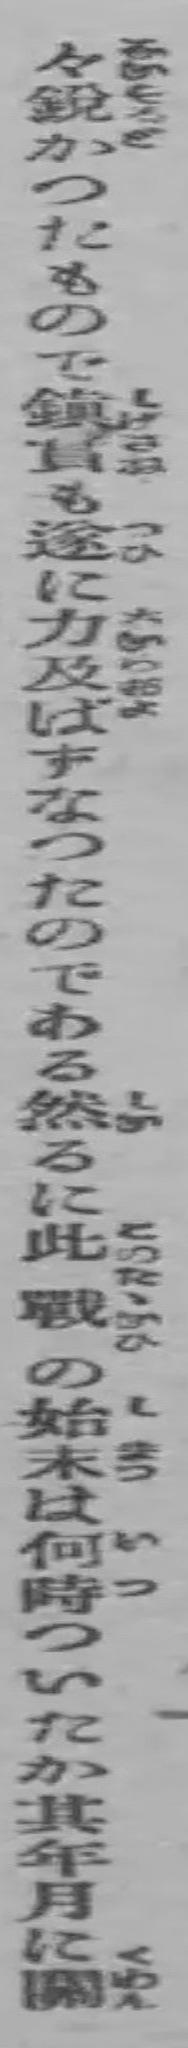中鋭かつたもので鎮実も遂に力及ばずなつたのである然るに此戦の始末は何時ついたか其年月に関
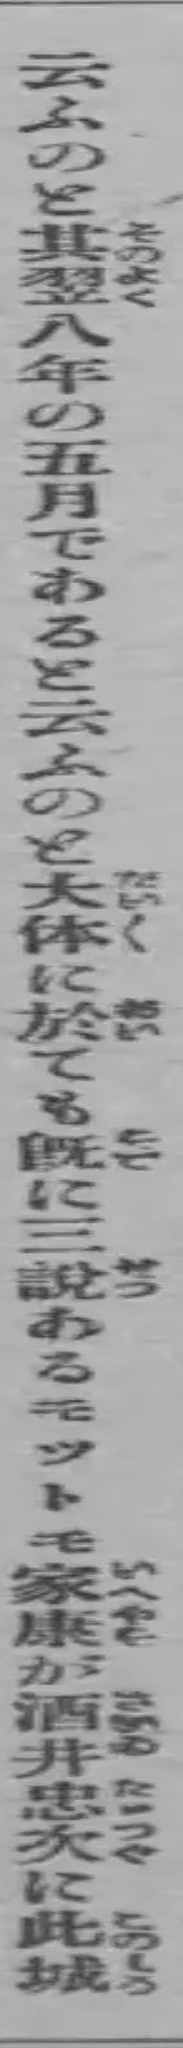云ふのと其翌八年の五月であると云ふのと大体に於ても既に三説あるモツトモ家康が酒井忠次に此城
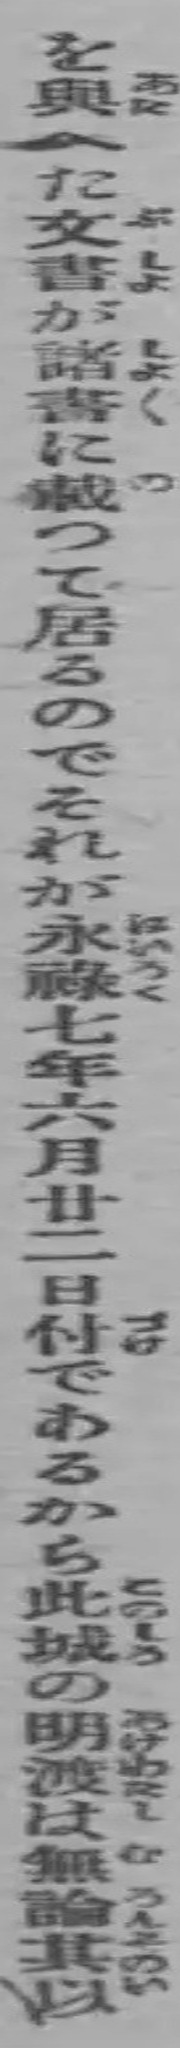を与へた文書が諸書に載つて居るのでそれが永禄七年六月廿二日付であるから此城の明渡はむ無論其以

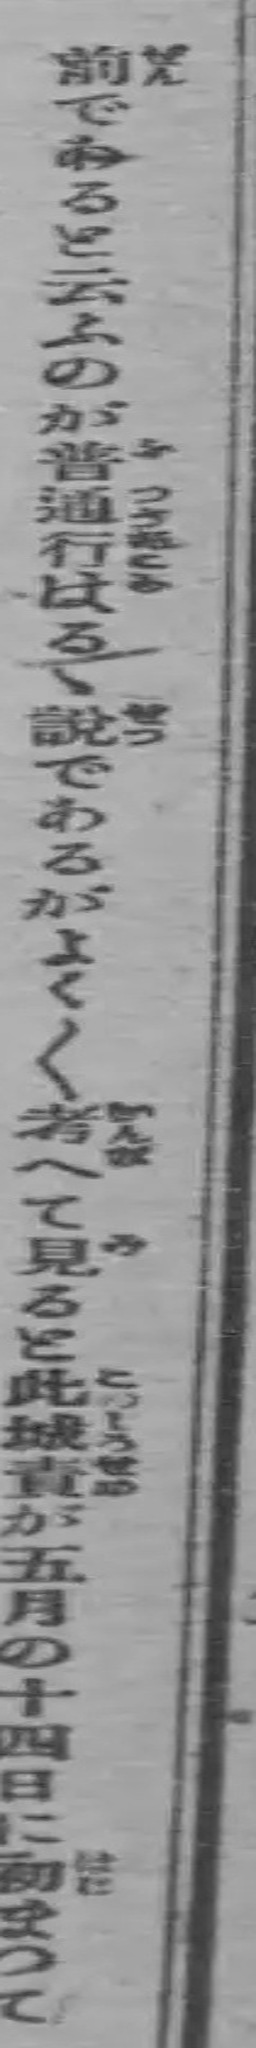前であると云ふのが普通行はるゝ説であるがよく〳〵考へて見ると此城責が五月の十四日に初まつて
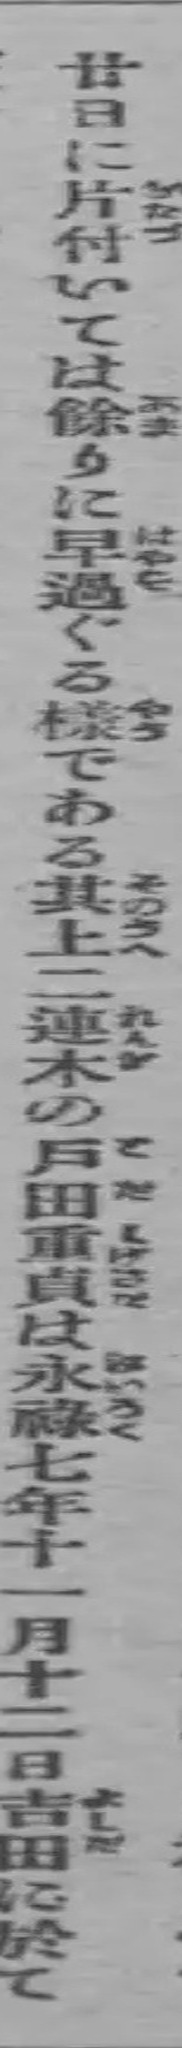廿日に片付いては余りに早過ぐる様である其上二連木の戸田重貞は永禄七年十一月十二日吉田に於て
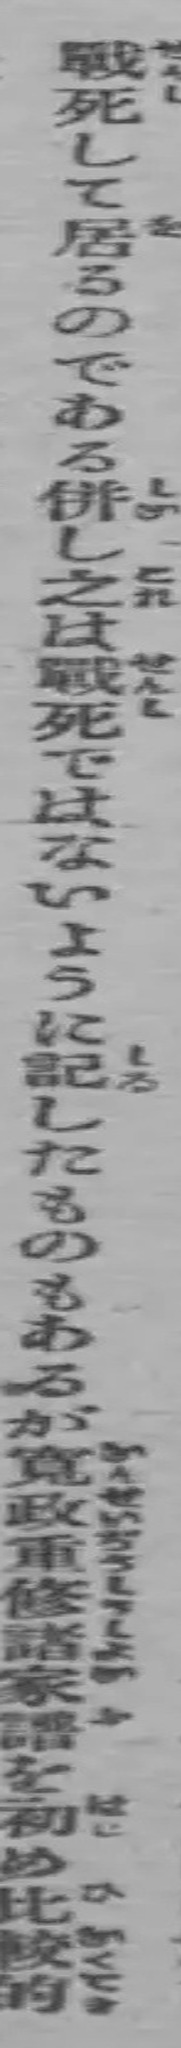戦死して居るのである併し之は戦死ではないように記したものもあるが寛政重修諸家譜を初め比較的
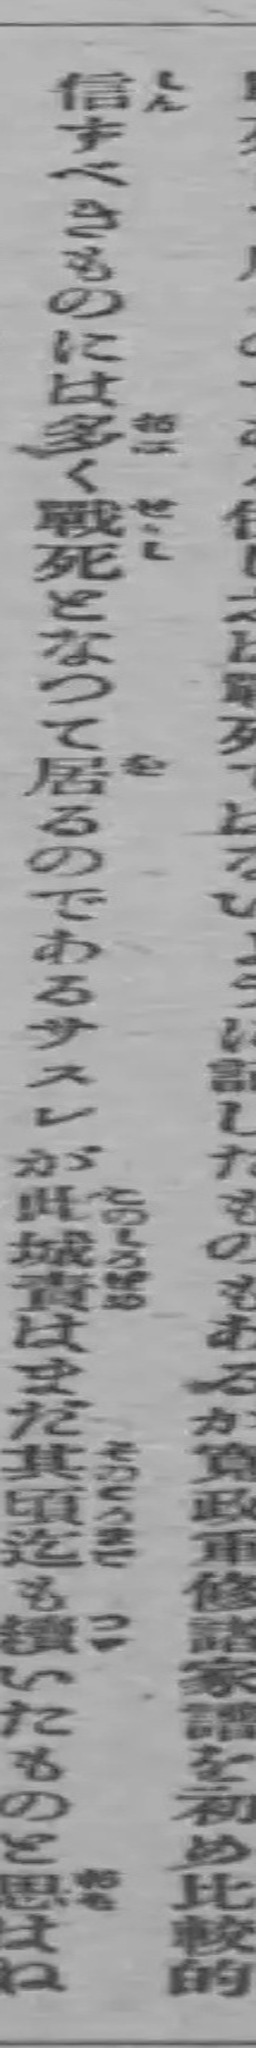信ずべきものには多く戦死となつて居るのであるサスレが此城責はまだ其頃迄も続いたものと思はね
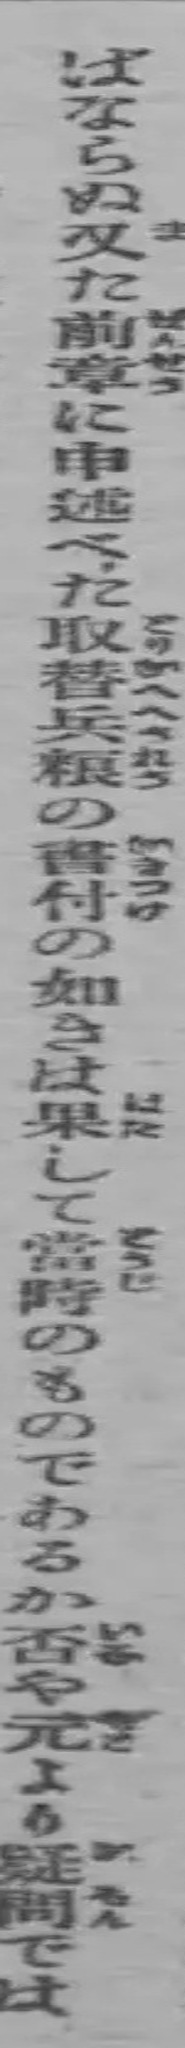ばならぬ又た前章に申述べた取替兵糧の書付の如きは果して当時のものであるか否や元より疑問では
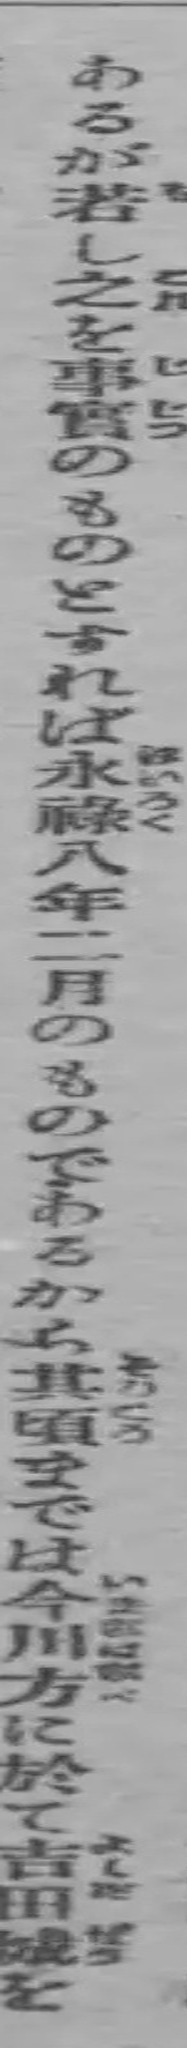あるが若し之を事実のものとすれば永禄八年二月のものであるから其頃までは今川方に於て吉田城を
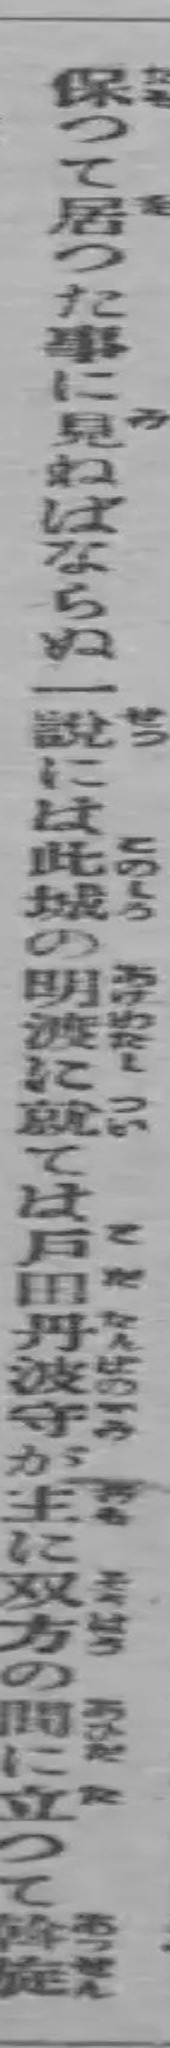保つて居つた事に見ねばならぬ一説には此城の明渡に就ては戸田丹波守が主に双方の間に立つて斡旋
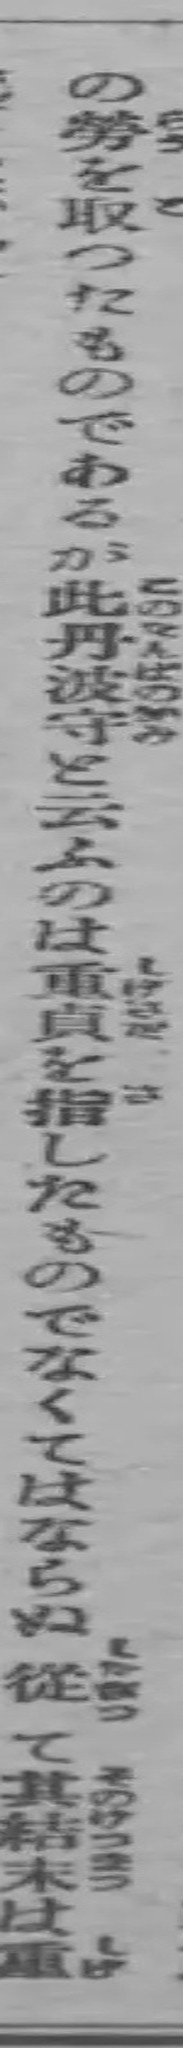の労を取つたものであるが此丹波守と云ふのは重貞を指したものでなくてはならぬ従て其結末は重
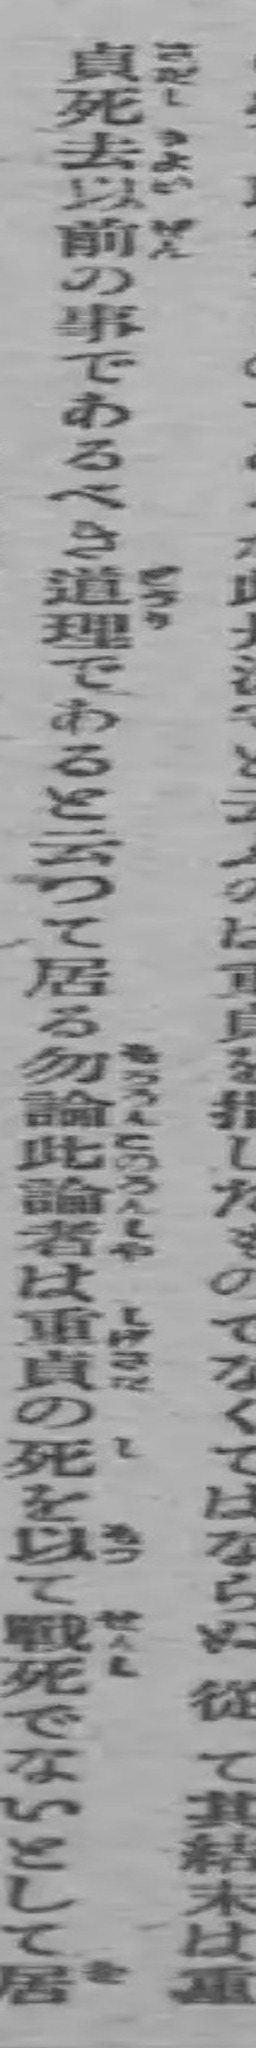貞死去以前の事であるべき道理であると云つて居る勿論此論者は重貞の死を以て戦死でないとして居
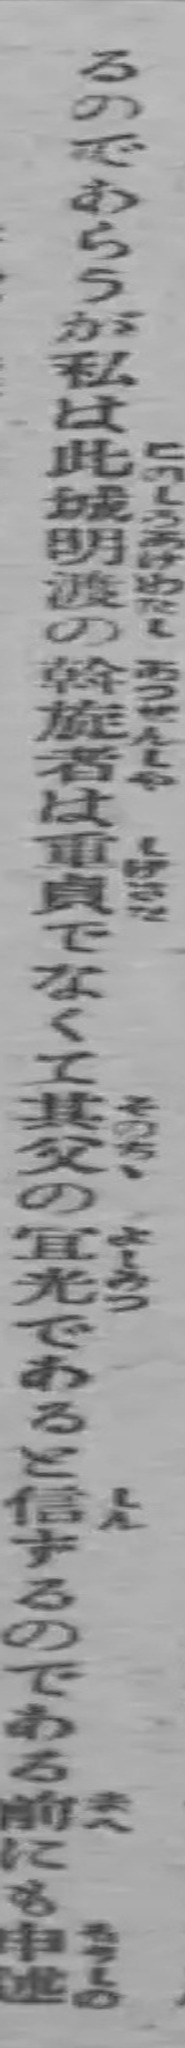るのであらうが私は此城明渡の斡旋者は重貞でなくて其父の宜光であると信ずるのである前にも申述
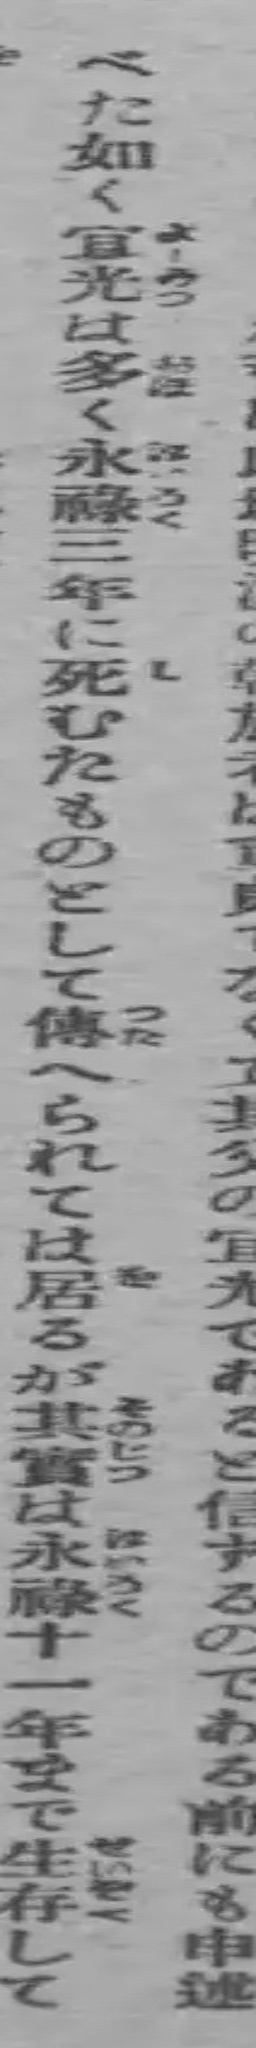べた如く宜光は多く永禄三年に死むたものとして伝へられては居るが其実は永禄十一年まで生存して
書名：豊橋市史談
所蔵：国立国会図書館 National Diet Library, JAPAN
